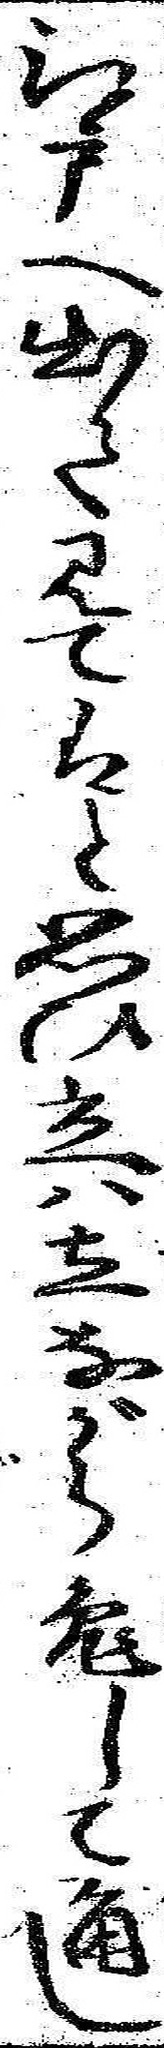江戸へ出て見てはと思ひ立は立ながら兎して角し
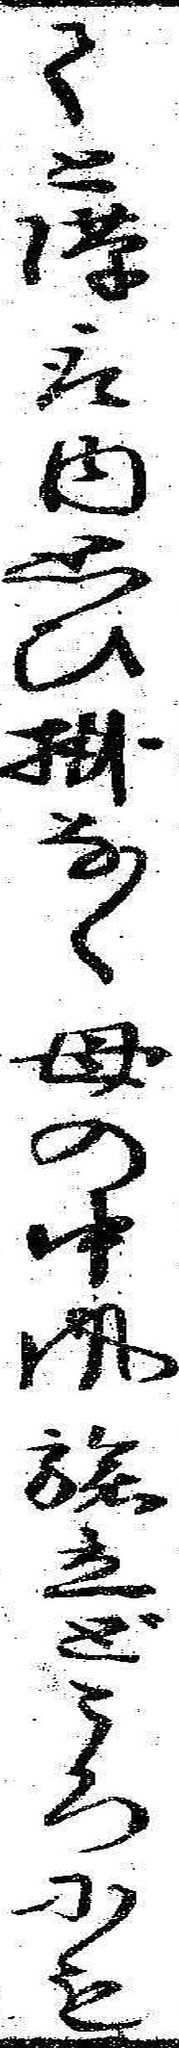てと隙取内思ひ掛なく母の中風旅立どころにも
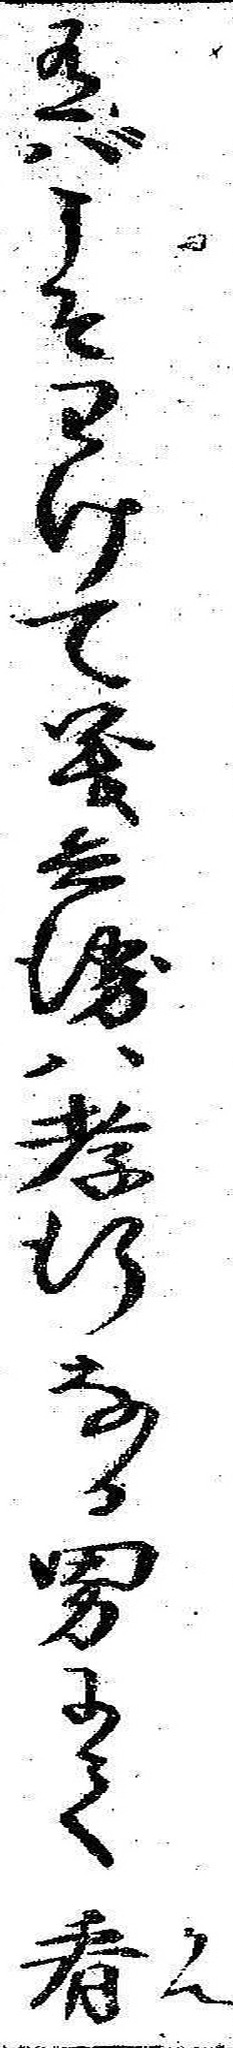有ばこそわけて義兵衛は孝行なる男にて看
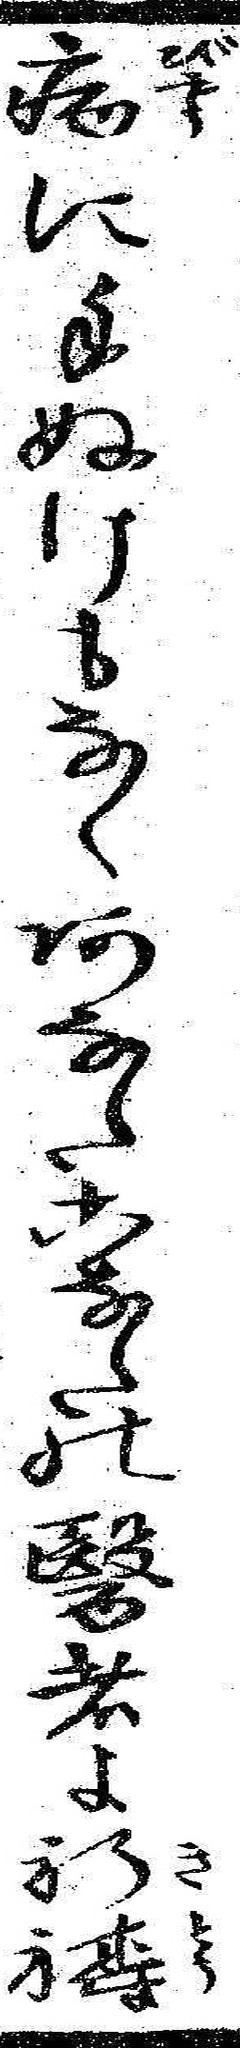病に手ぬけもなくあなたこなたの医者よ祈祷
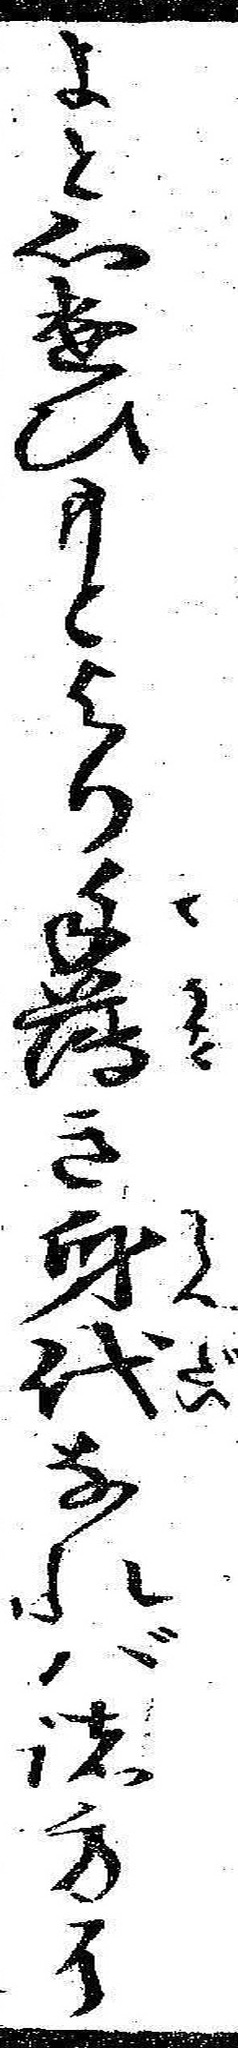よと心遣ひもとより手薄き身代なれば諸方に
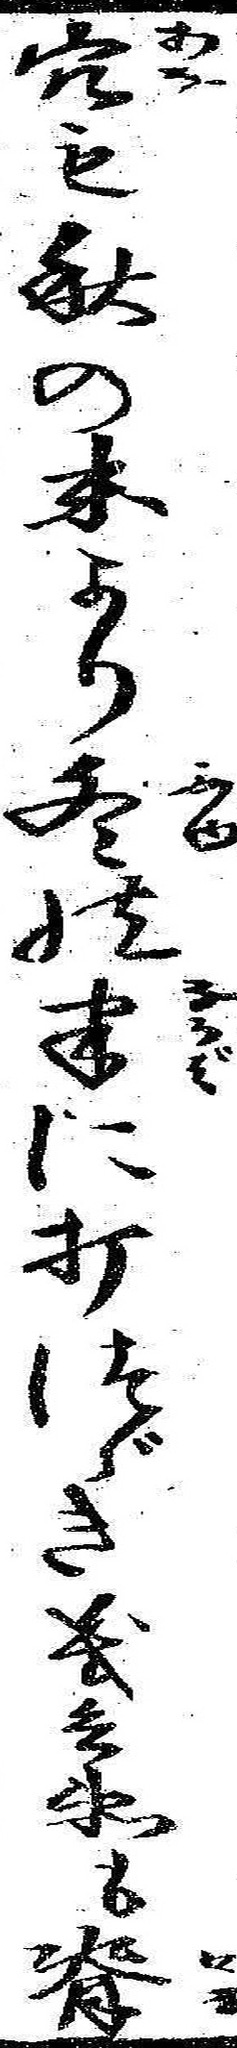穴も秋の末より冬の半に打つゞき義兵衛も脊
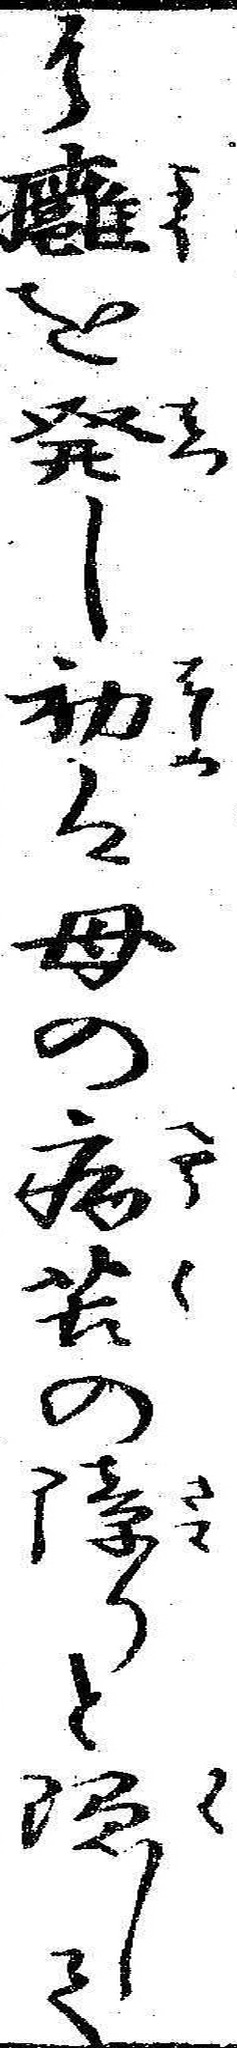に廱を発し初は母の病苦の障りと隠して
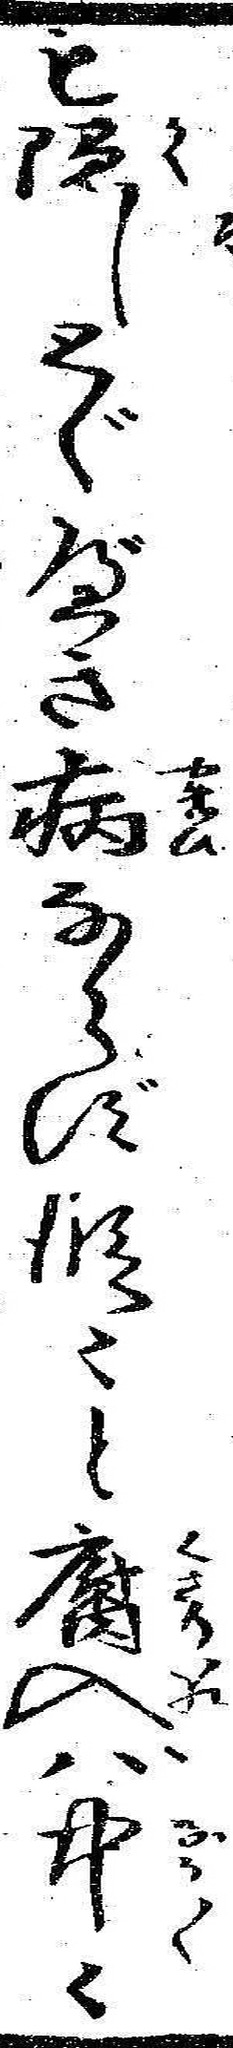も隠しとぐべき病ならず段々と腐入ば中々
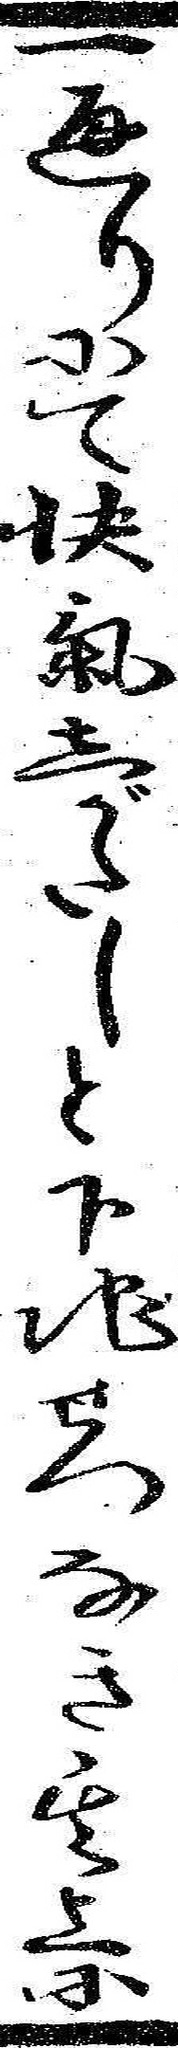一通りにて快気しがたしと下地せつなき其上に
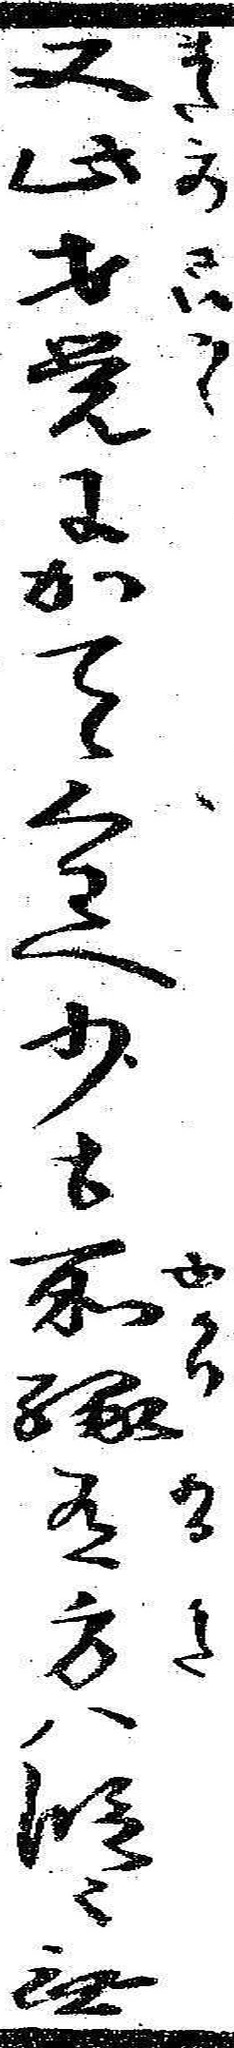又此才覚にかてゝくわへ少も所縁有方は段々無
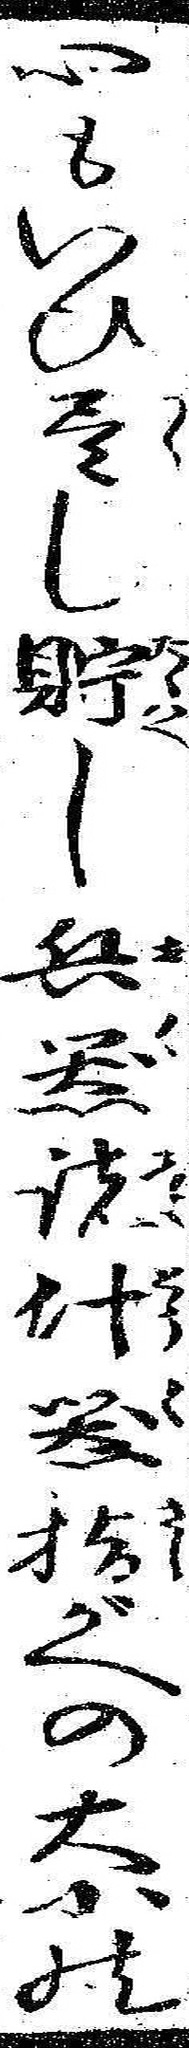心もいひ尽し貯し兵器諸什器指がへの大小の
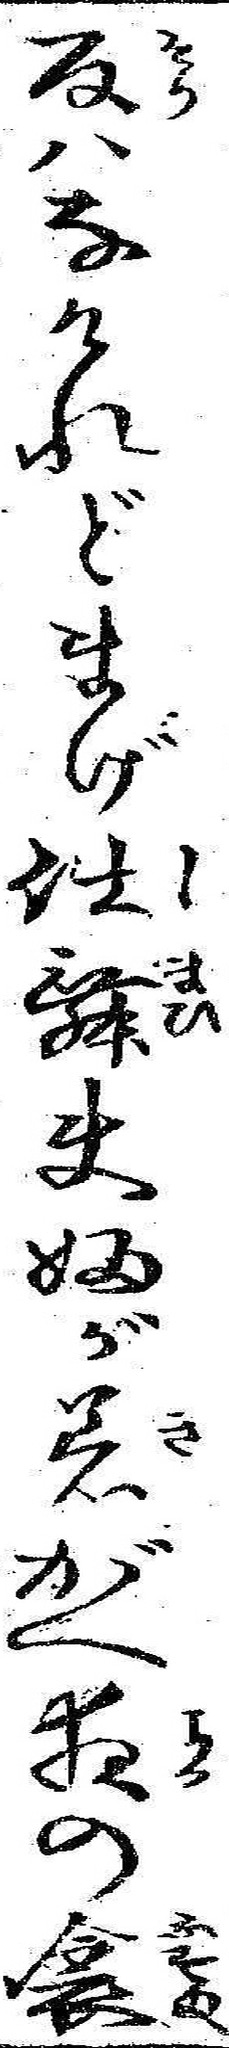反はなけれどまげ仕舞夫婦が着がへ夜の衾
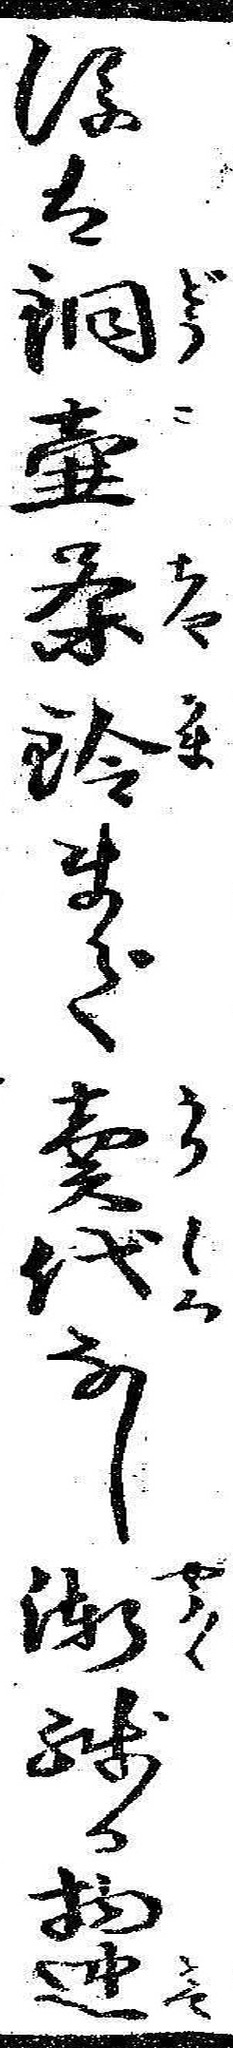後は銅壷茶鈴まで売代なし漸残る物迚
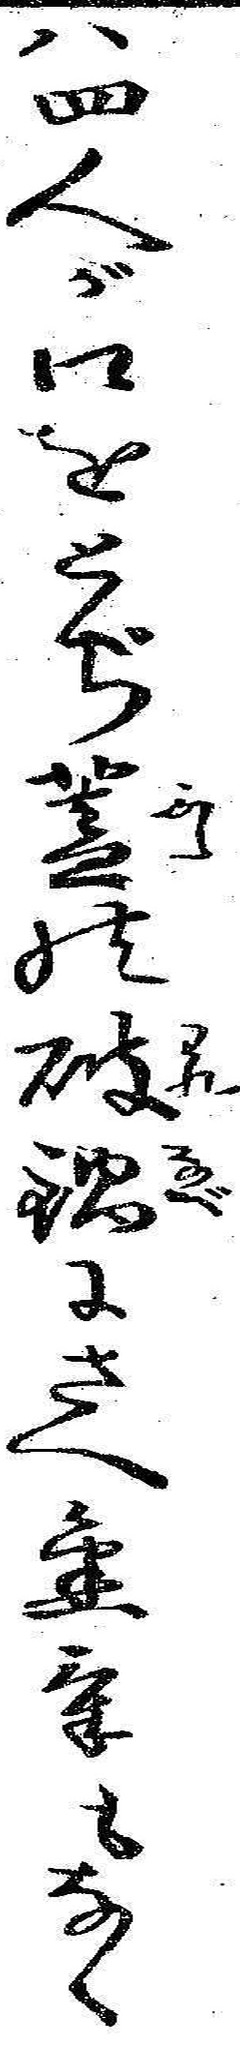は四人が口をとぢ蓋の破鍋にさへ金気もなく
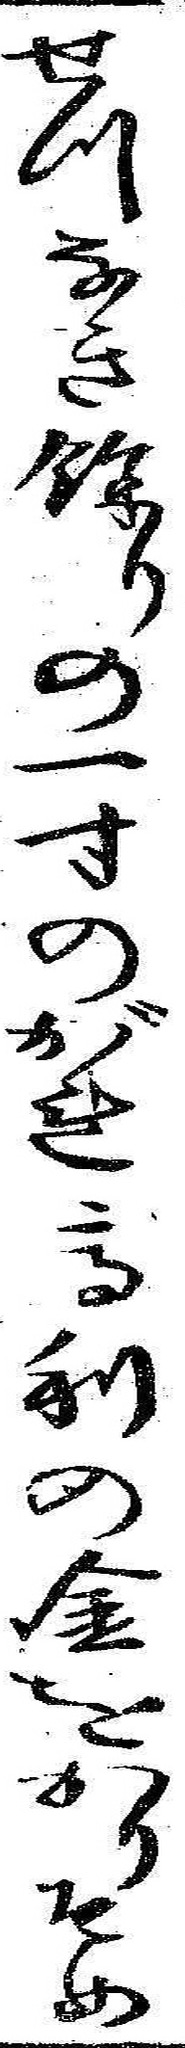せつなき余りの一寸のがれ高利の金をかりそめ
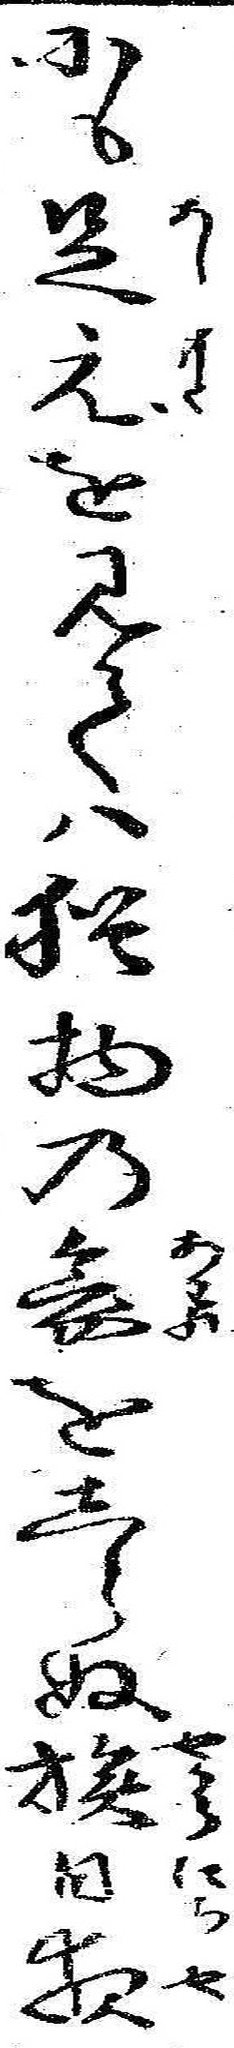にも足元を見ては猶物の哀をしらぬ族日夜
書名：根無草後編
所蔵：国文学研究資料館
